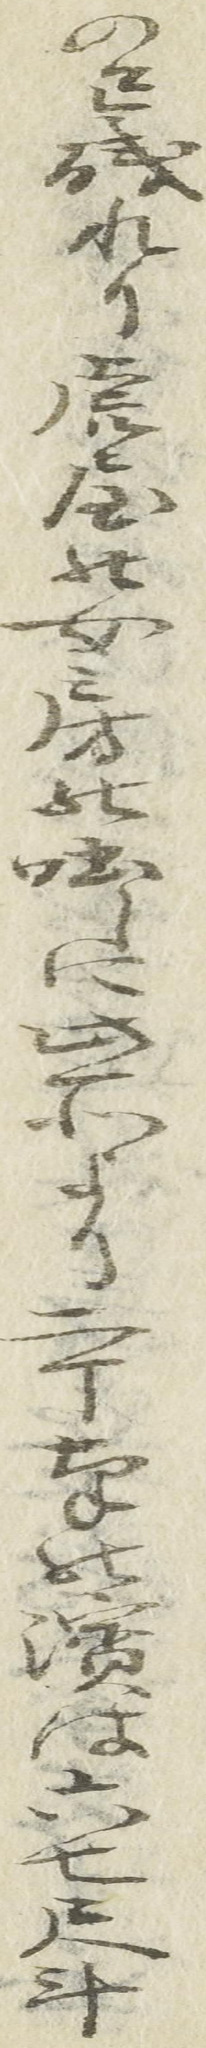のみ残れり虎屋の女房の咄しに此所より二丁南の濱は六七尺斗
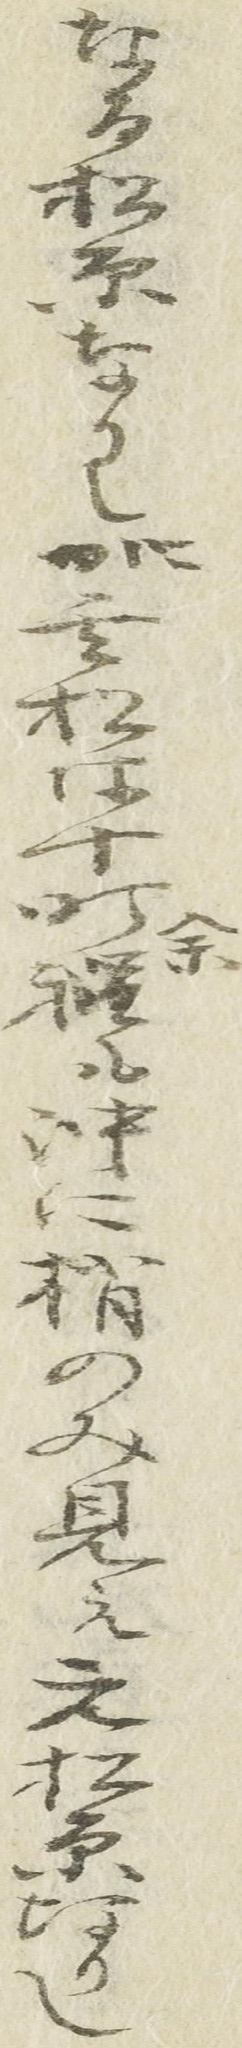なる松原なりしが其松は十町程も沖に梢のみ見え元松原なりし
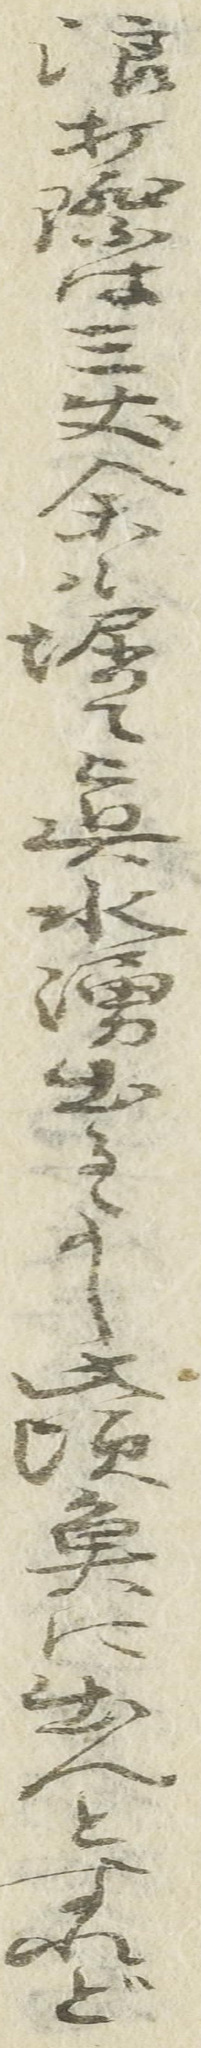浪打際は三丈余も堀て眞水湧出るよし此頃魚に出んとすれど
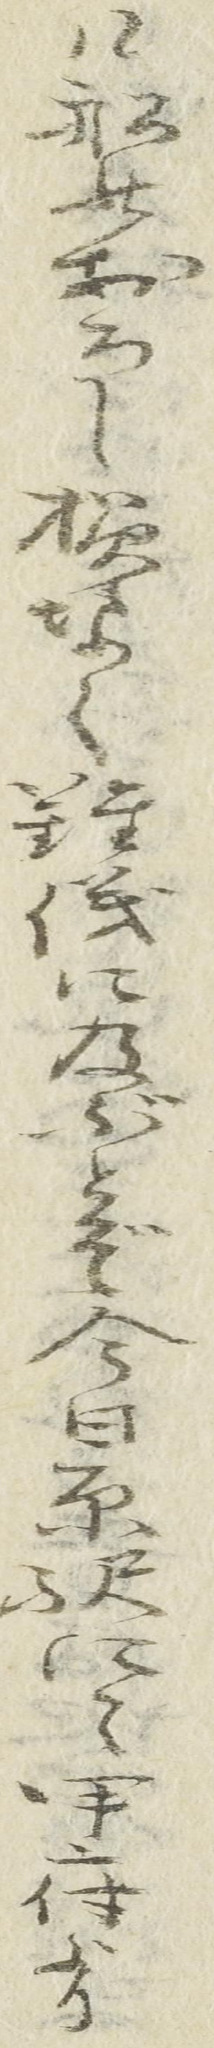も舩のおろし様なく難儀に及ぶとぞ今日原駅にて甲府より
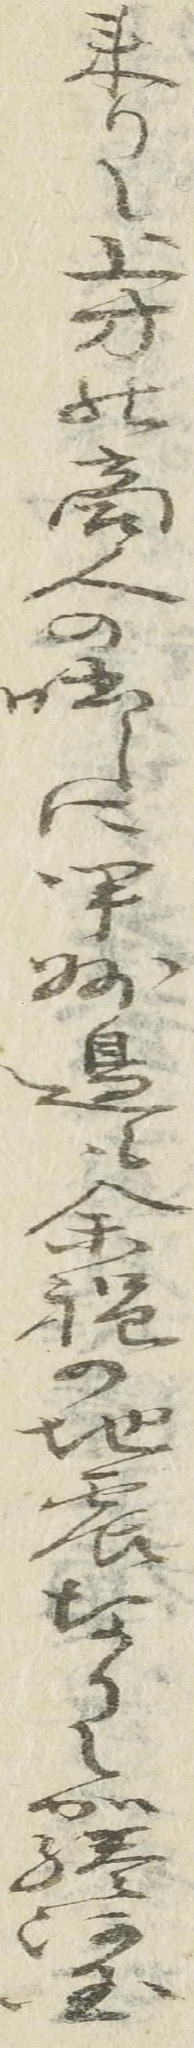来りし上方の商人の咄に甲州邊も余程の地震なりしか駿河国
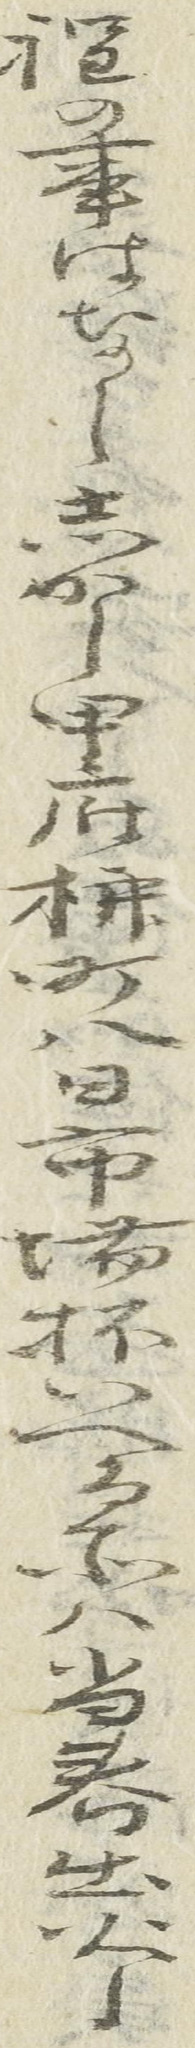程の事はなししかし甲府柳町八日市場抔いへる所は当春出火し
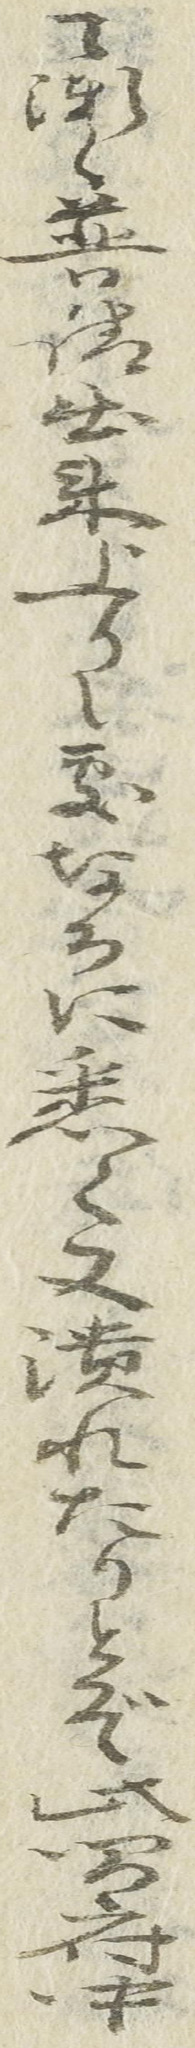て漸く普請出来上りし處なるに悉く又潰れたりとぞ此間府中
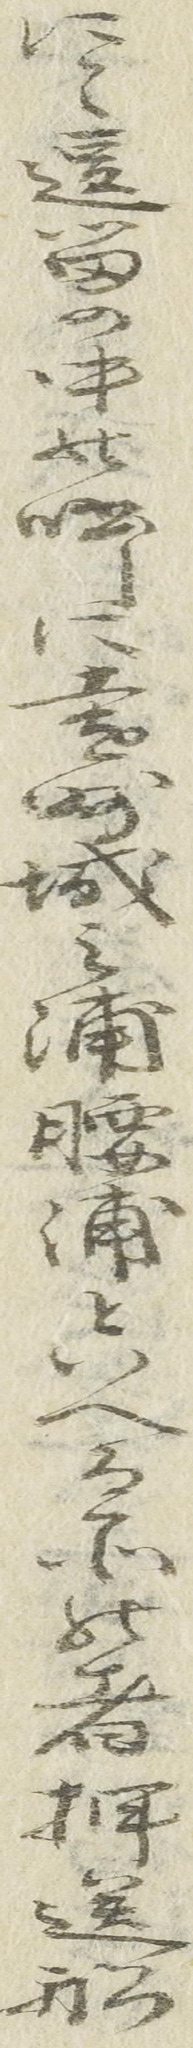にて逗留の中の咄しに遠州城之浦腰浦といへる所の者押送舩
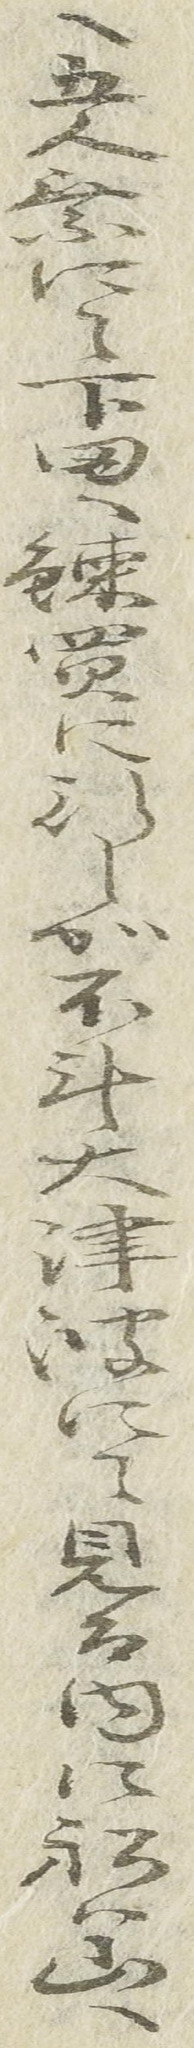へ五人乗にて下田へ鰊買に行しか不計大津波にて見る内に船ハ山へ
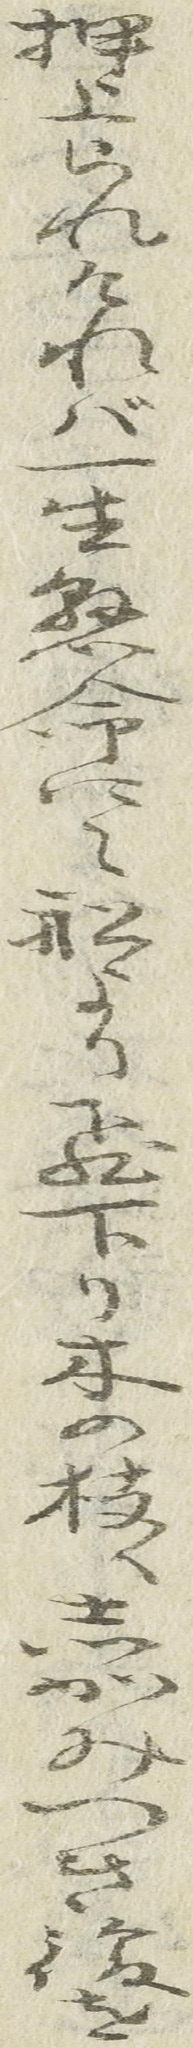押上られけれバ一生懸命にて舩より飛下り木の枝へしかみつき後を
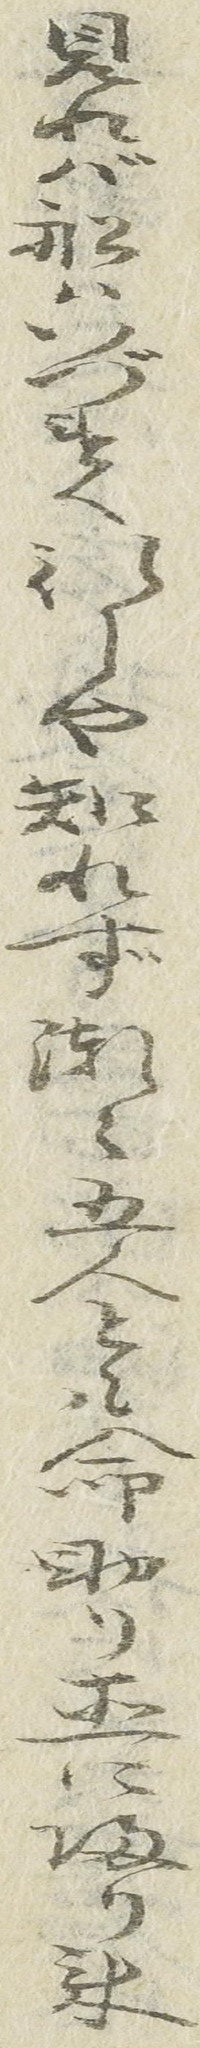見れバ舩はいづれへ行しや知れず漸く五人とも命助り直に帰り来
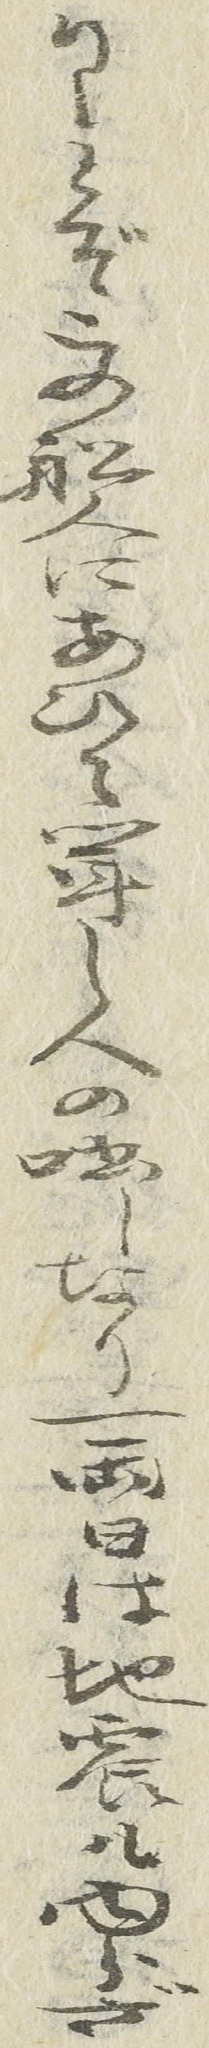りしとぞこの舩人にあひて聞し人の咄しなり一両日は地震もゆらざ
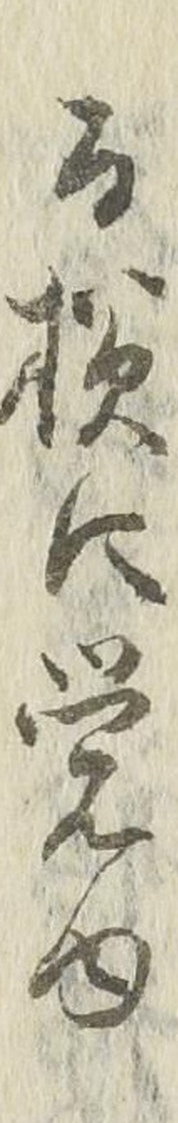る様に覚ゆ
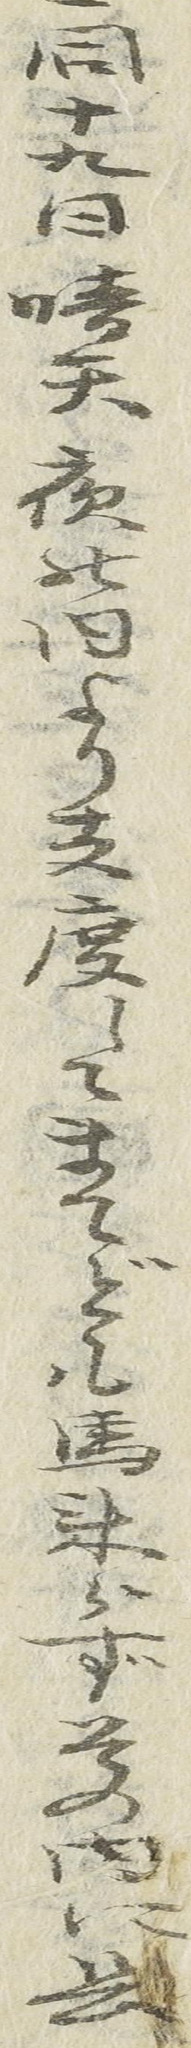一同十九日晴天夜の内より支度してまてども馬来らず其内に長
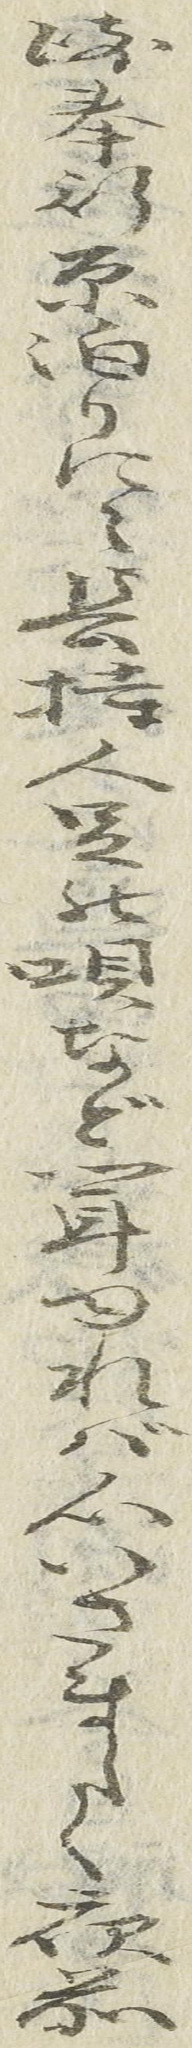崎奉行原泊りにて長持人足の唄など聞ゆれバ心いさましく夜前
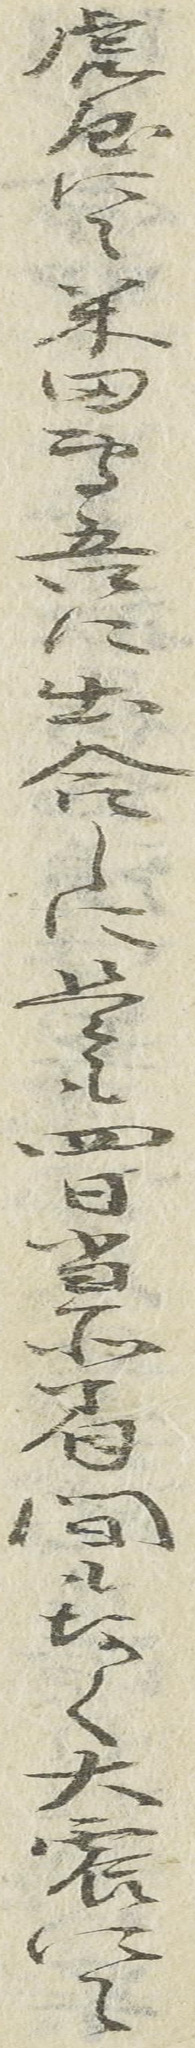虎屋にて米田専吾に出合しに是も四日当所着間もなく大震にて
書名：地震前兆集　全
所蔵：東京大学地震研究所図書室 Earthquake Research Institute Library, The University of Tokyo, JAPAN
